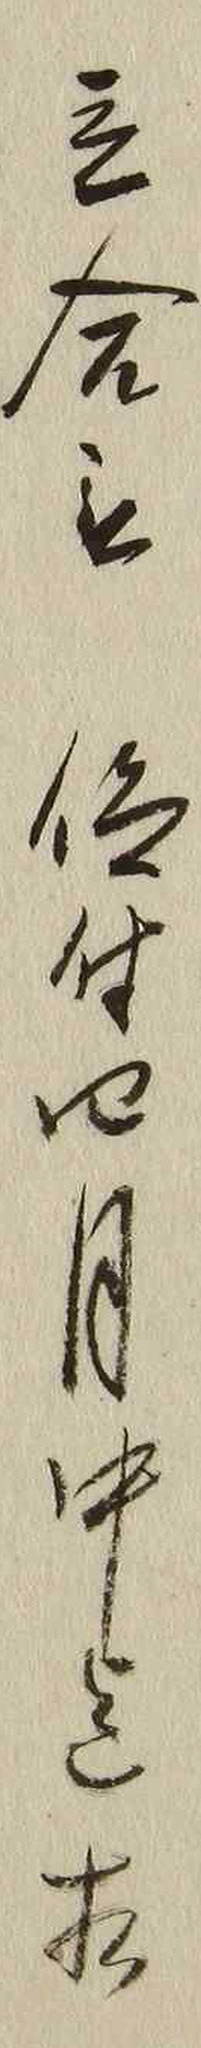立合被仰付四月中迄相
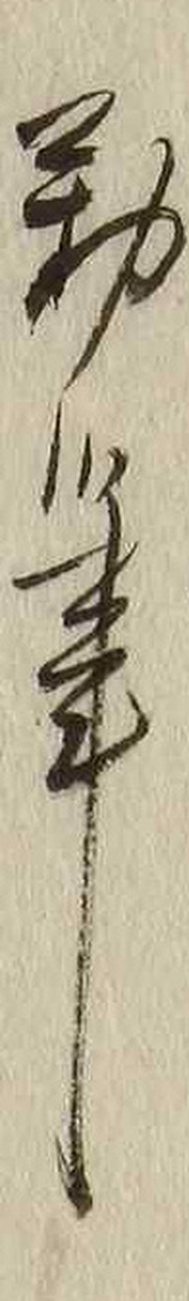勤候事
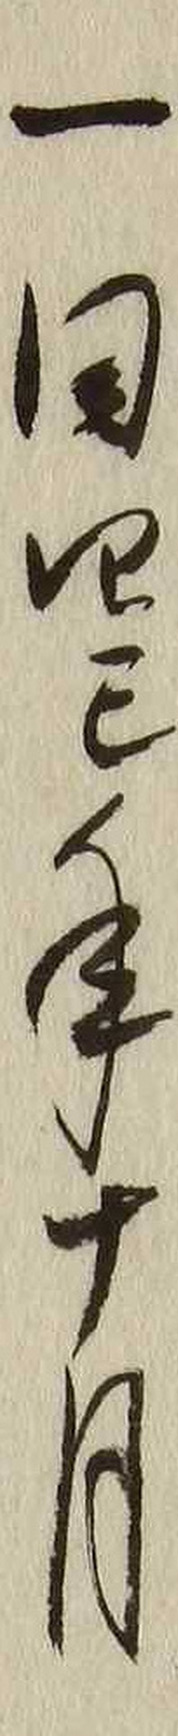一同四巳年十月
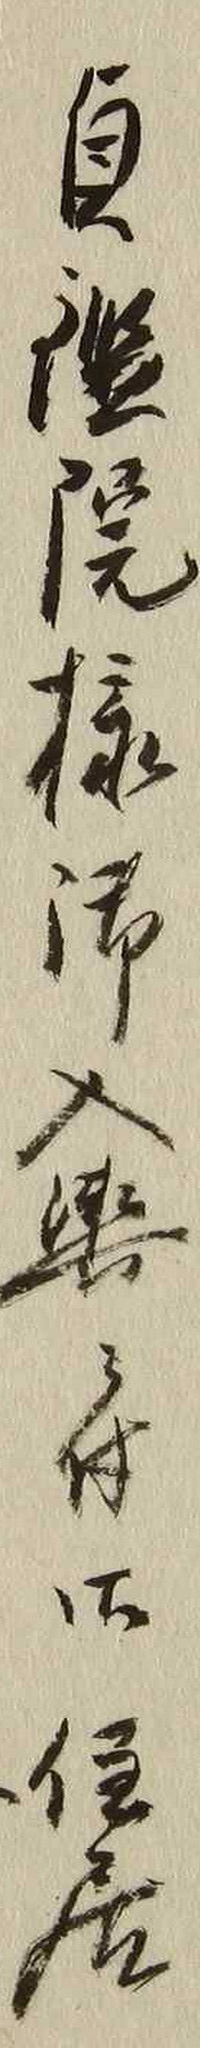貞鑑院様御入輿ニ付御住居
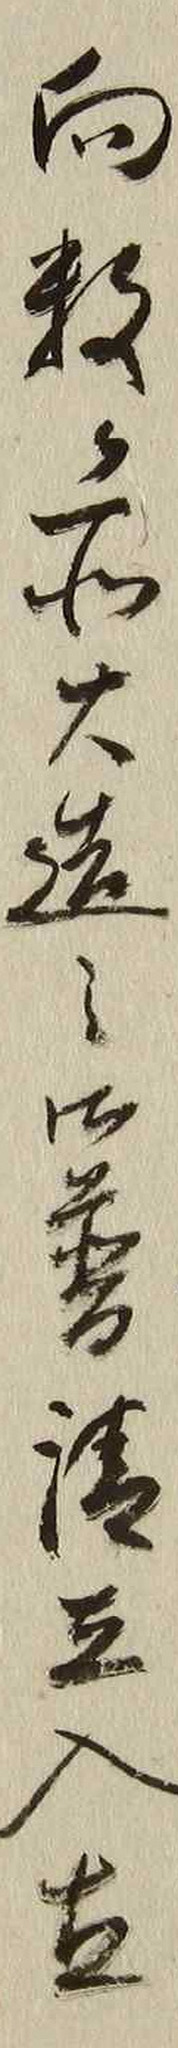向数ケ所大造之御普請立入立
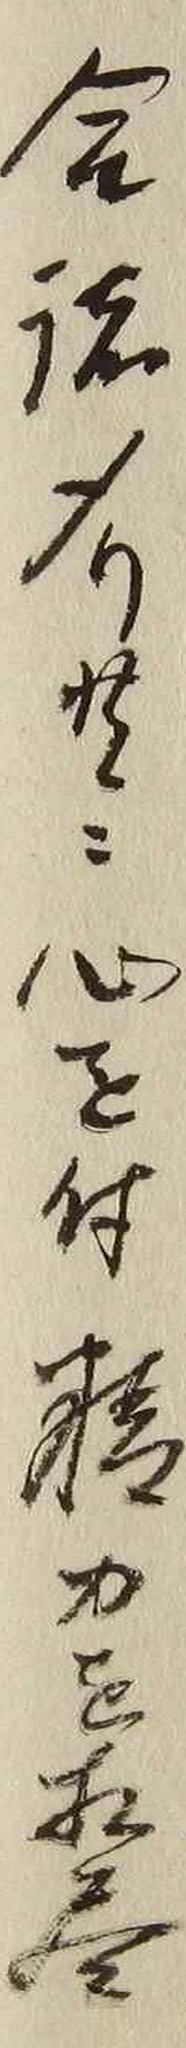合諸〆り共ニ心を付精力を相尽
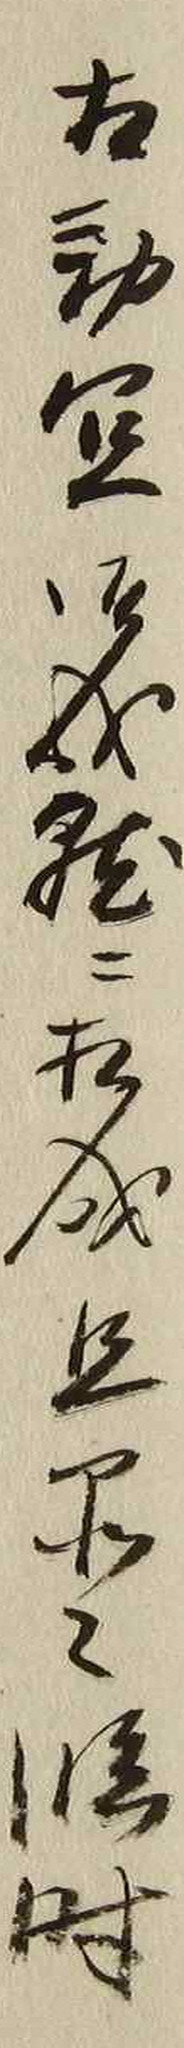相勤宜御成就ニ相成且品々臨時
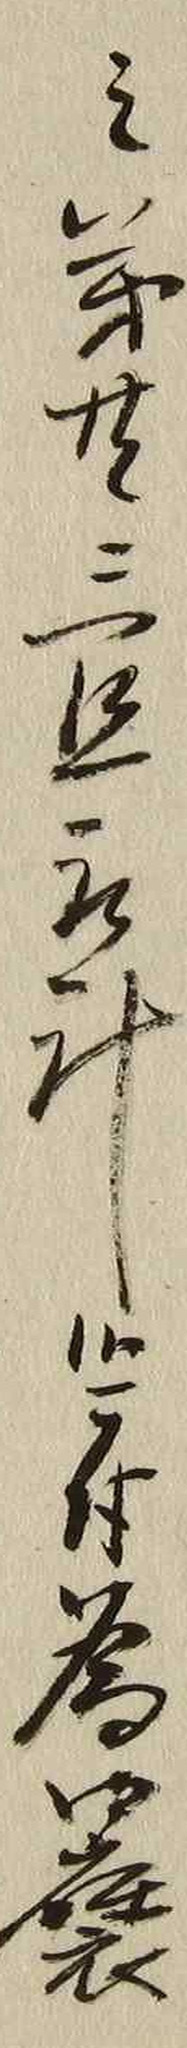之義共ニ宜取計候ニ付為御褒
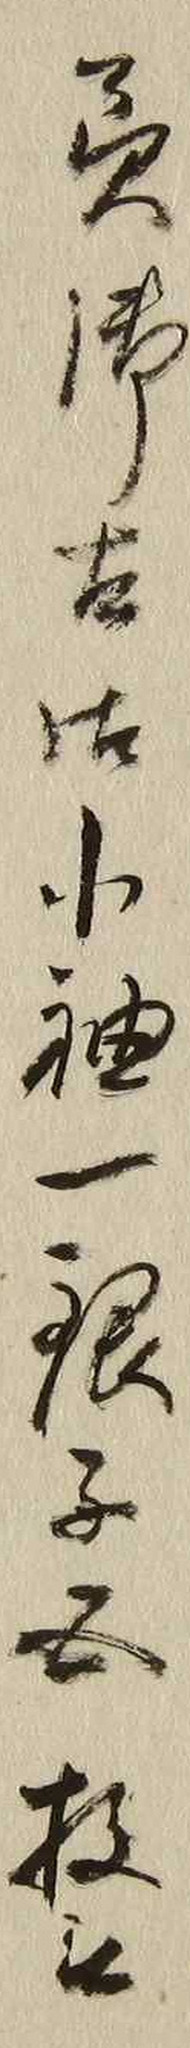美御古御小袖一銀子五枚被
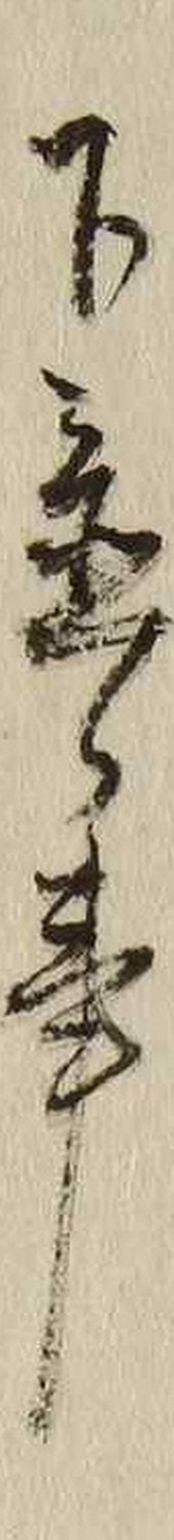下置候事
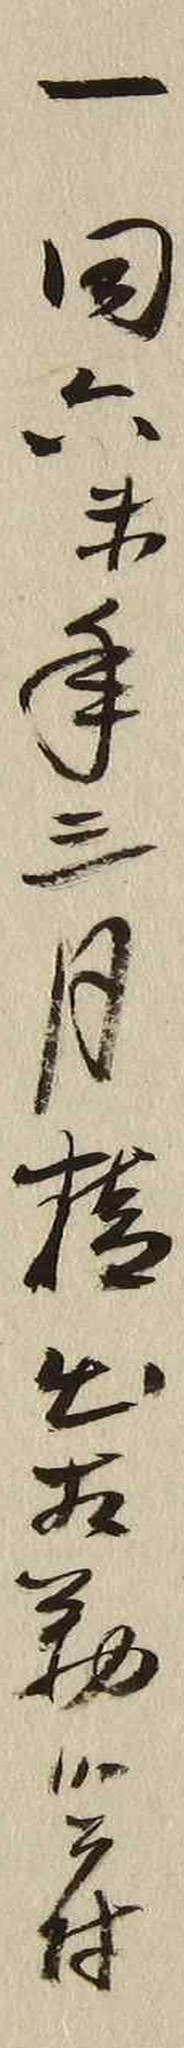一同六未年三月精出相勤候ニ付
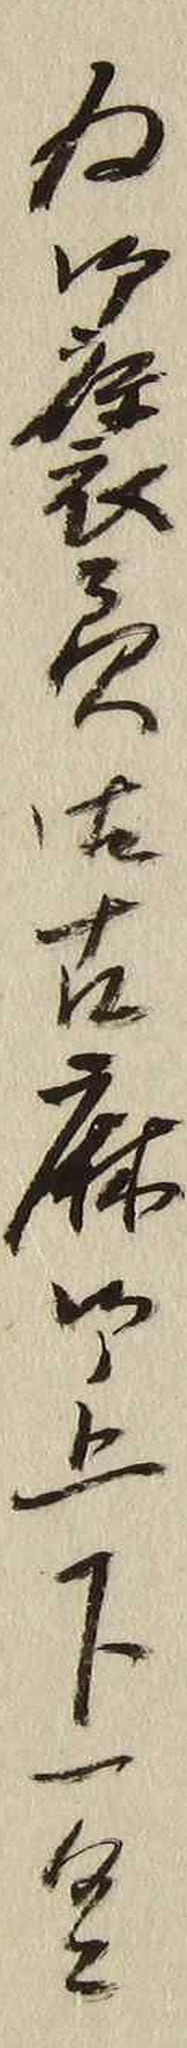為御褒美御古麻御上下一具
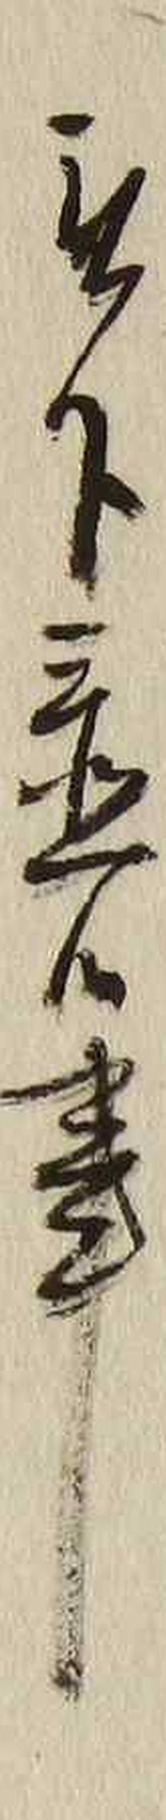被下置候事
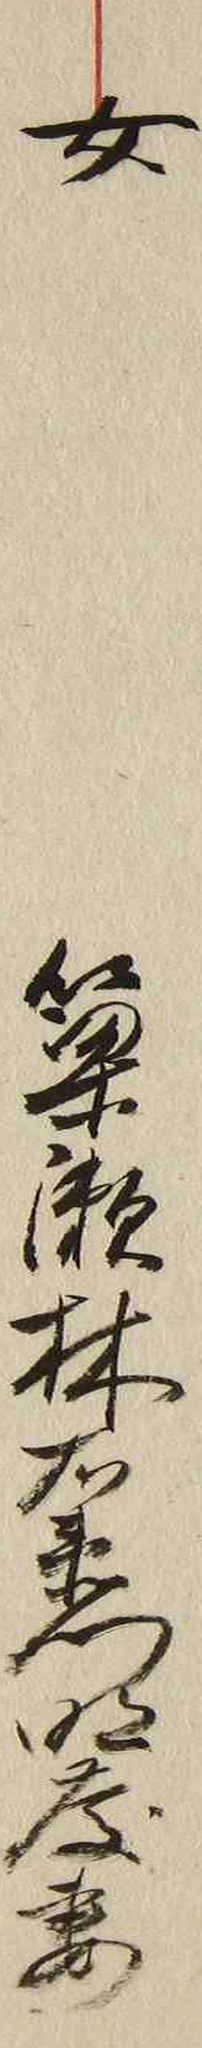女簗瀬林右衛門明度妻
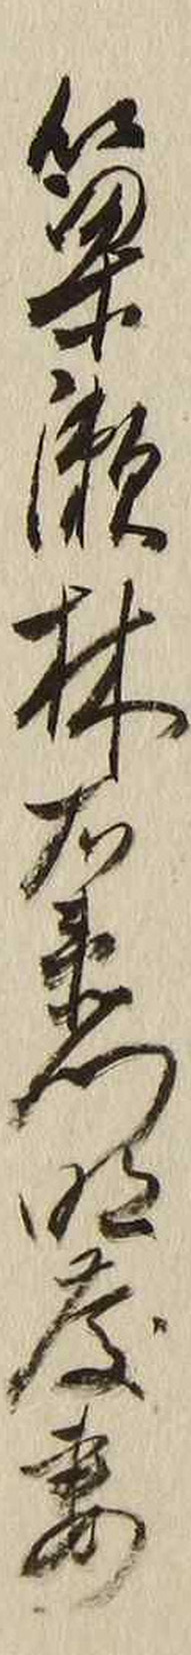女簗瀬林右衛門明度妻
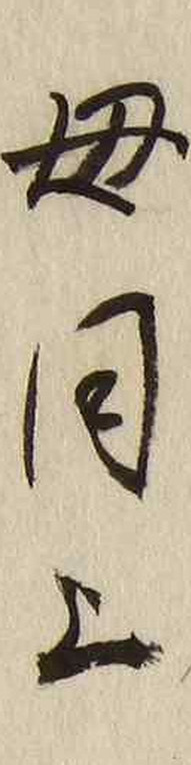母同上
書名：諸士系譜　巻之346　も之部2
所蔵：会津若松市立会津図書館
